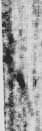又（有）
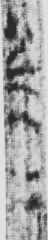爲
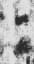爲
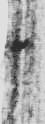之
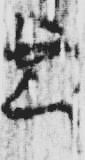也
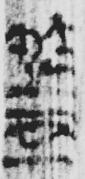箸（書）
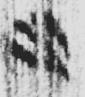又（有）
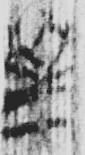爲
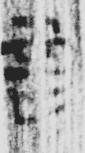言
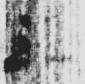之
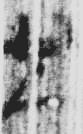也
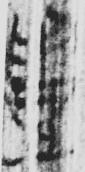豊（禮）
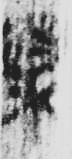樂
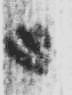又（有）
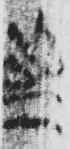爲
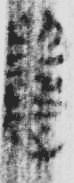○（舉）
